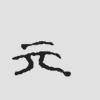亓（其）
